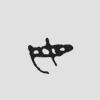母
